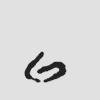㠯（以）
